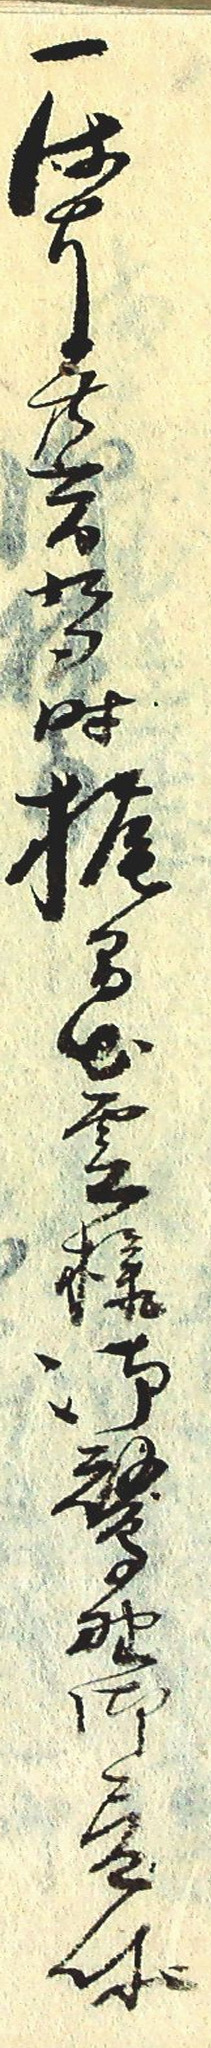一戌十月廿六日九つ時梶間出雲様御鷹野御昼休
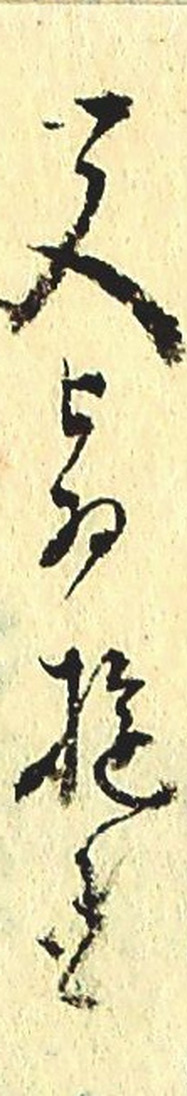御入被為遊候以上
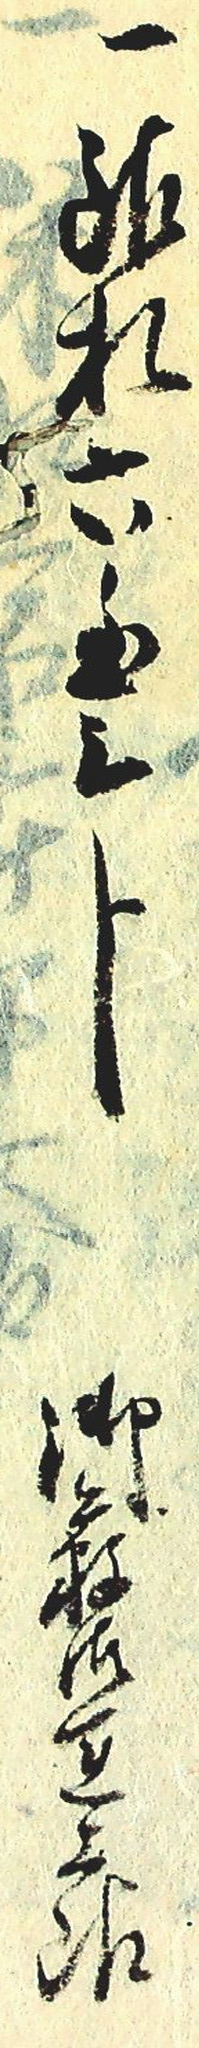一銀札六匁三分御藪御運上銀
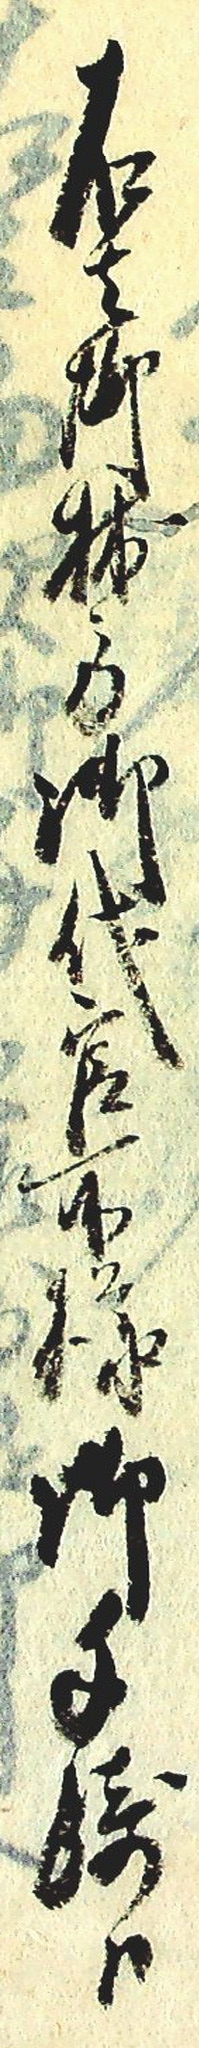右は御林方御代官所様御手崎え
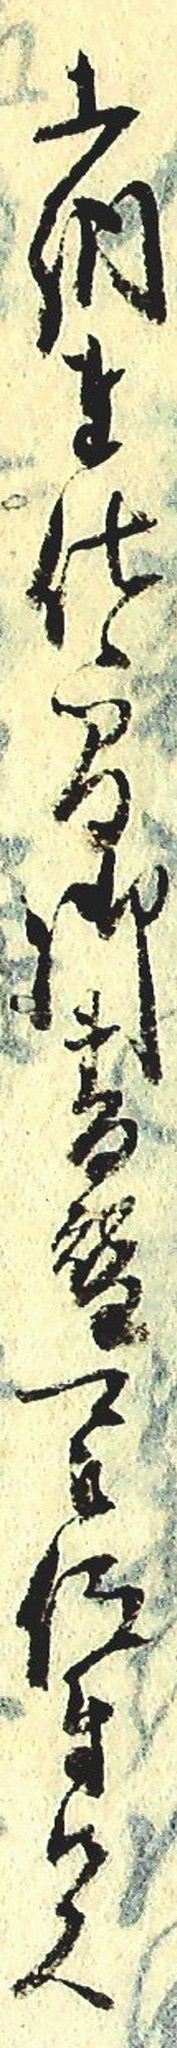上納奉仕候間御書替可被仰付候以上
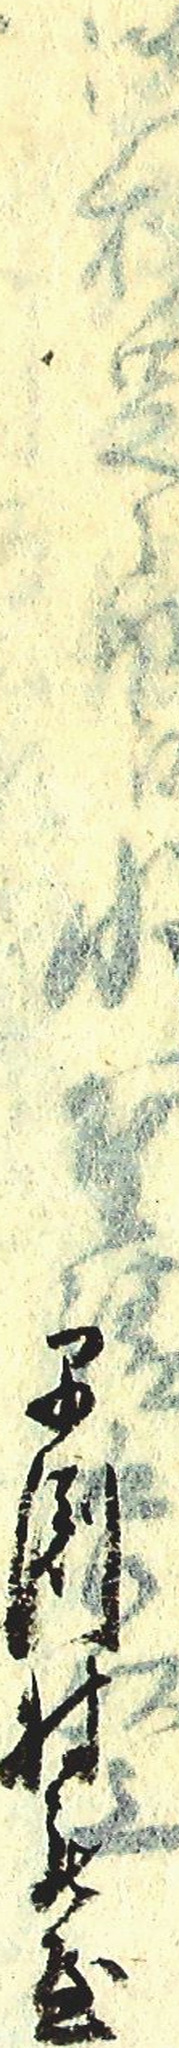早渕村庄屋
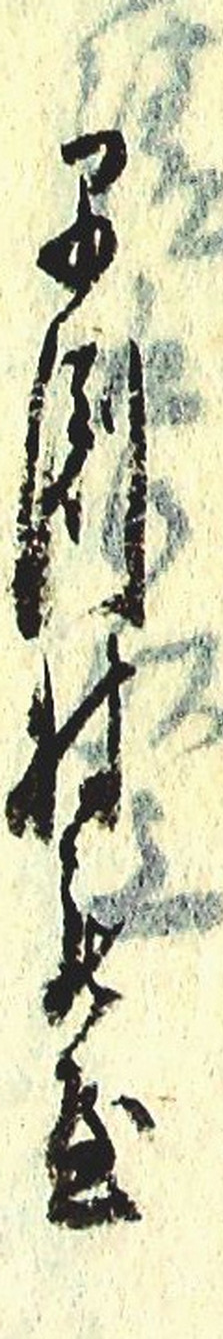早渕村庄屋
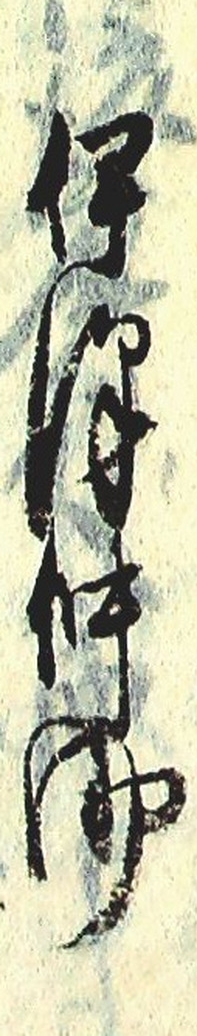伊沢仲助
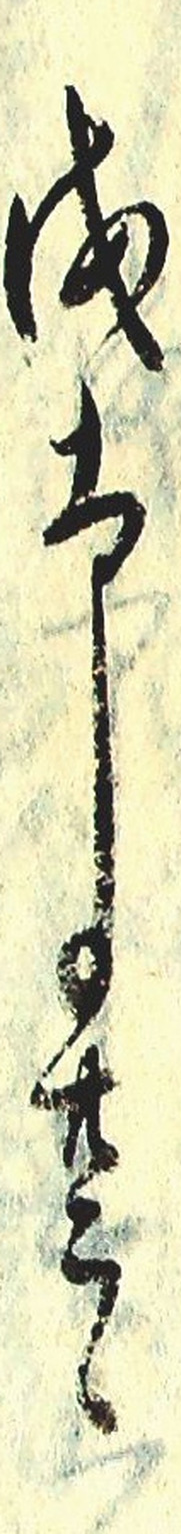戌十一月廿二日
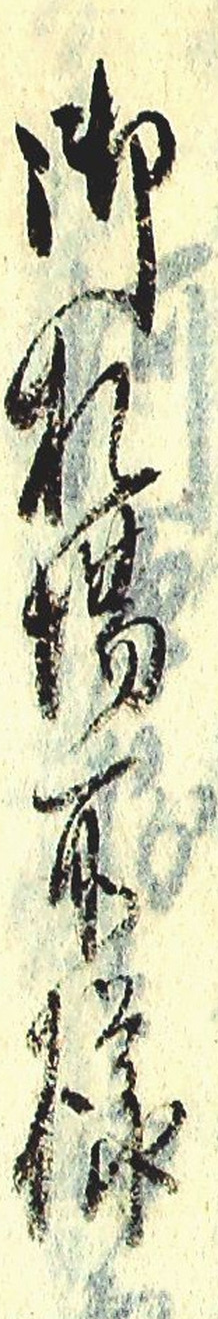御札場所様

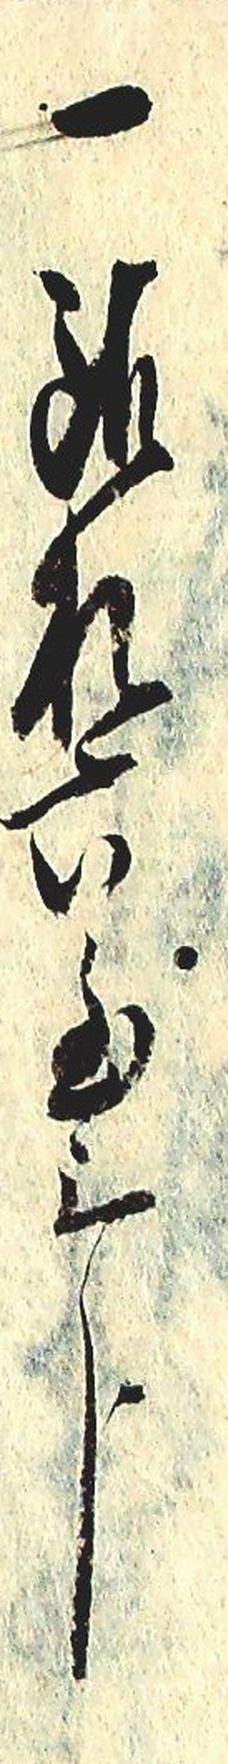一銀札六匁三分
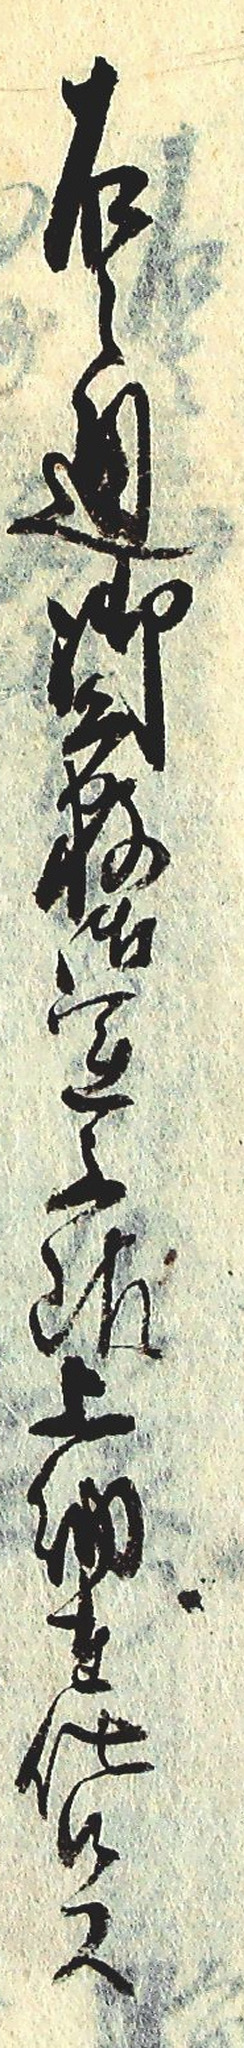右之通御藪御運上銀上納奉仕候以上
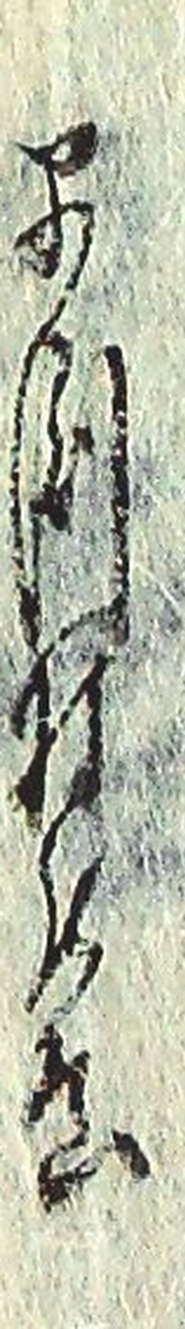早渕村庄屋
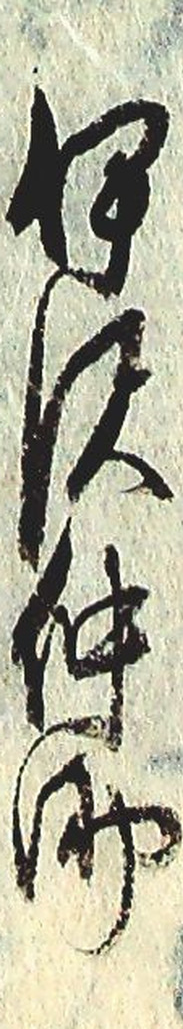伊沢仲助
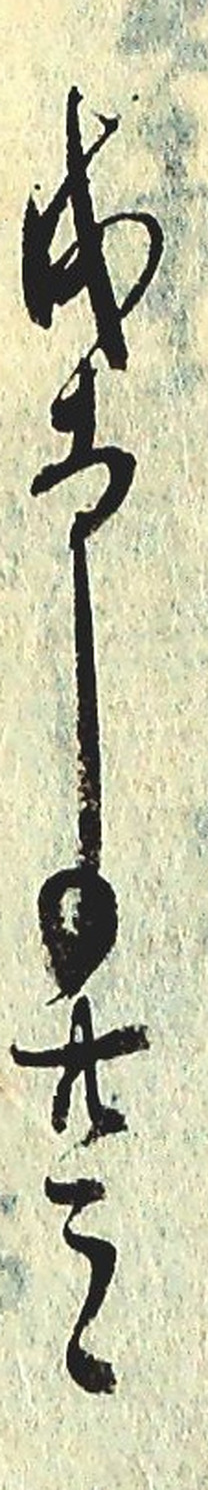戌十一月廿二日
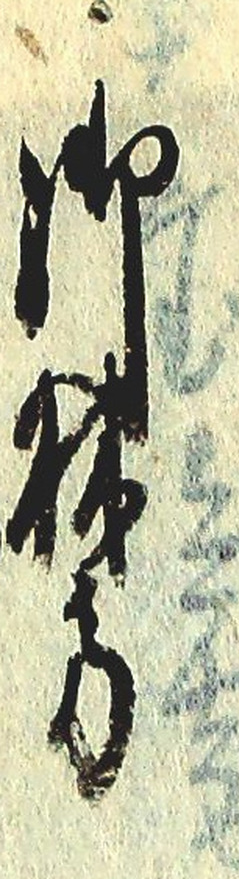御林方
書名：諸御願書控(弐番）
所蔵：鳴門教育大学 Naruto University of Education
